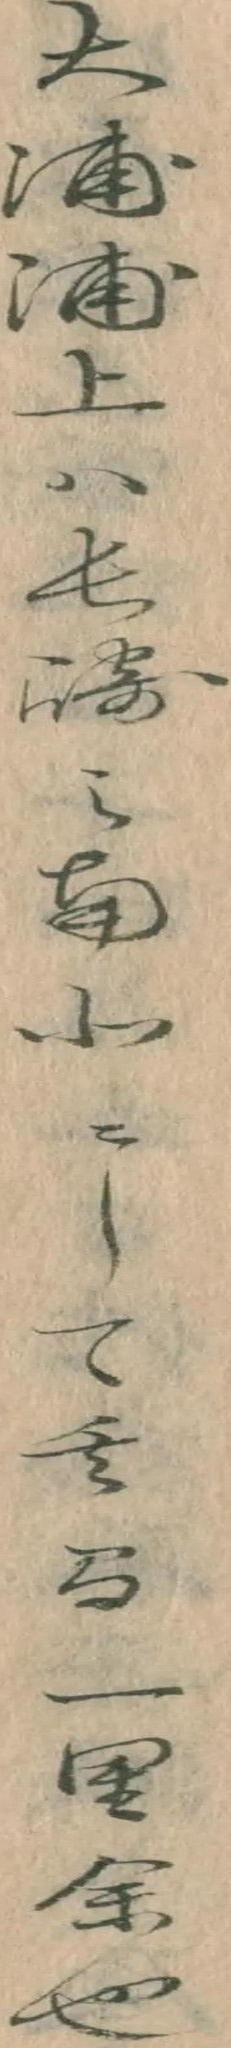大浦浦上は長崎之南北にして其間一里余也
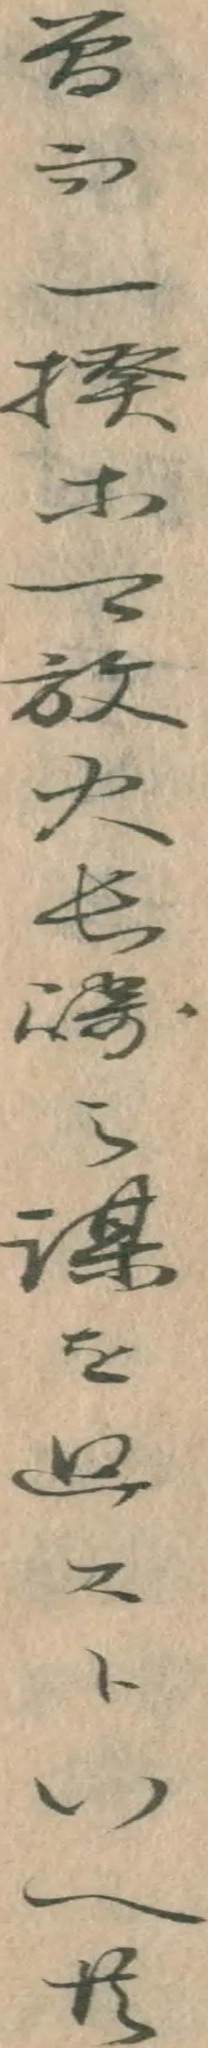曽而一揆等可放火長崎之謀を廻すといへ共
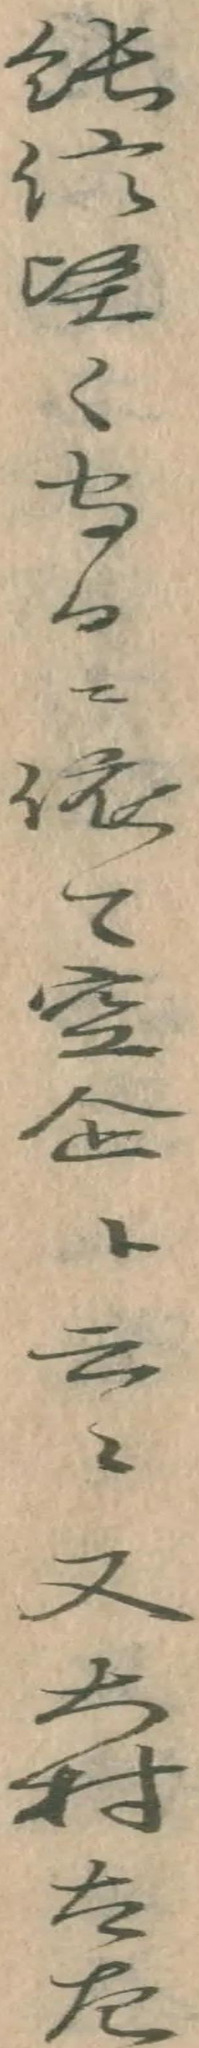純信堅く守るに依て空企と云々又大村太左
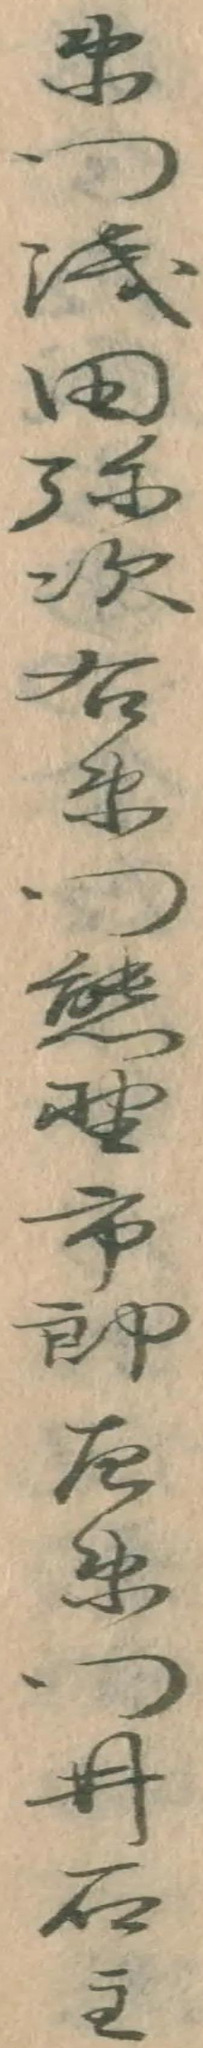衛門浅田弥次右衛門熊野市郞左衛門井石主

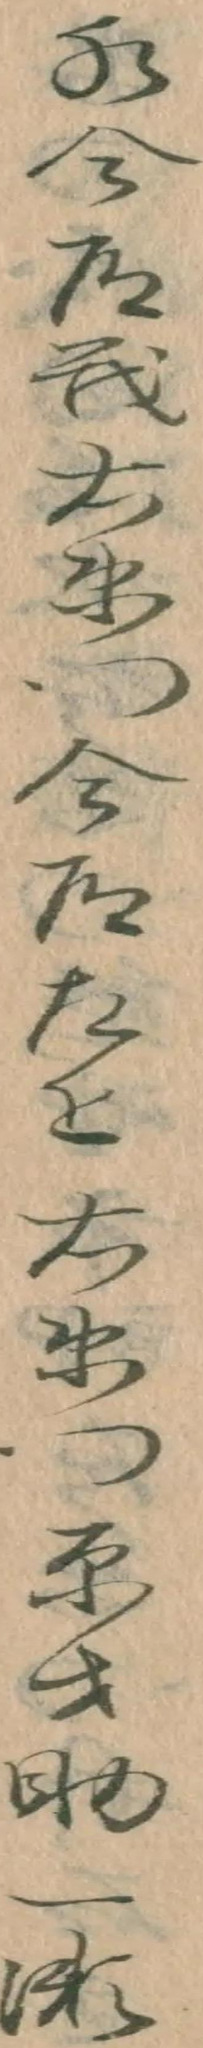水今道茂右衛門今道左近右衛門原才助一瀬
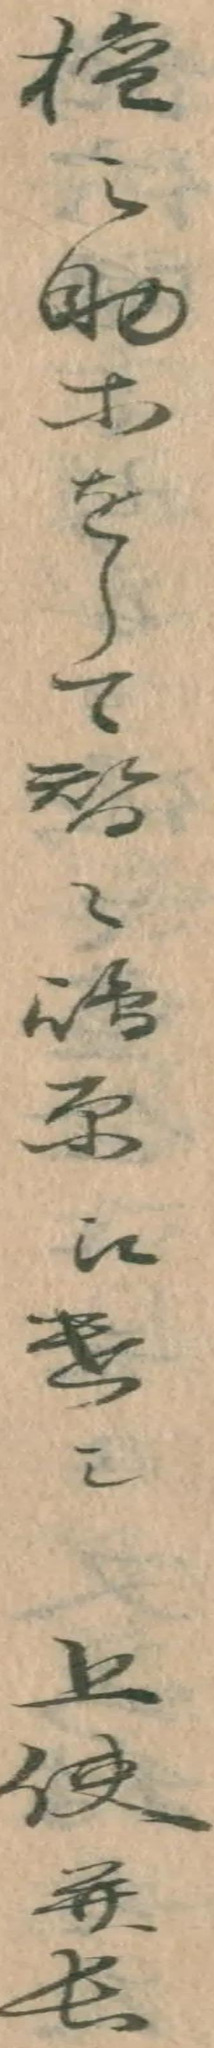権之助等をして替々島原江遣し上使并長
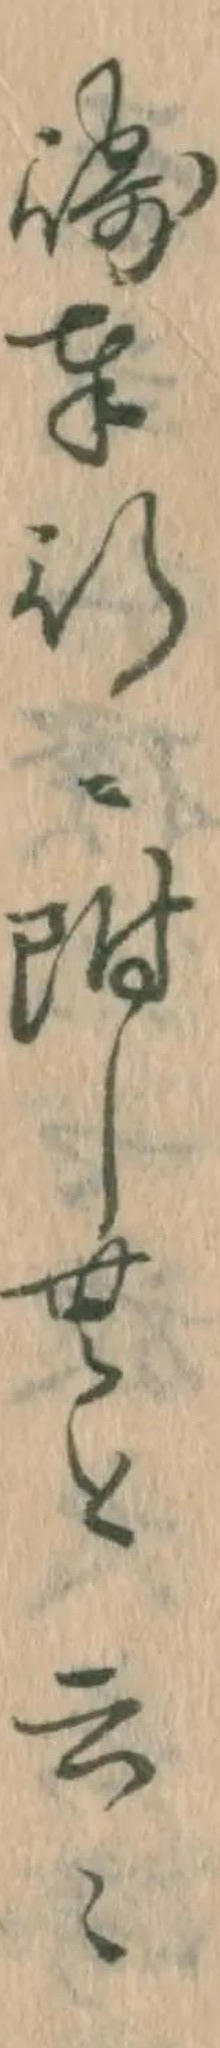崎奉行に附しむと云々
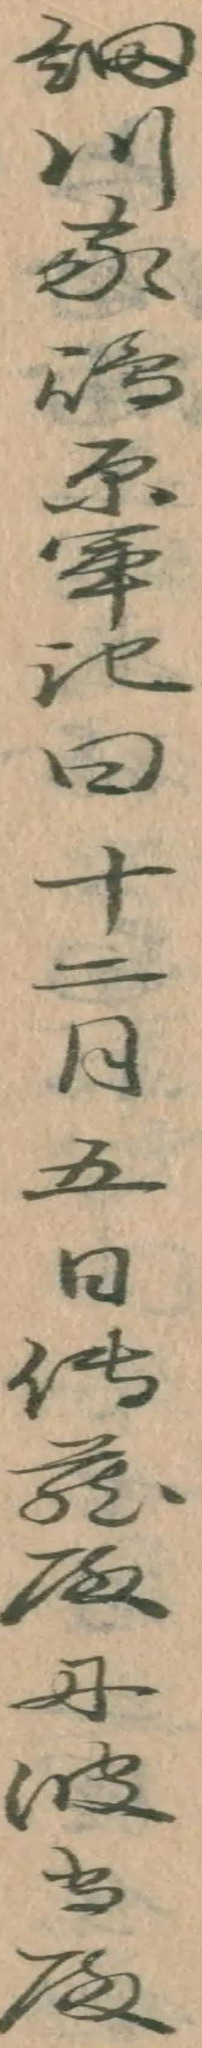細川家島原軍記曰十二月五日伝蔵殿丹波守殿
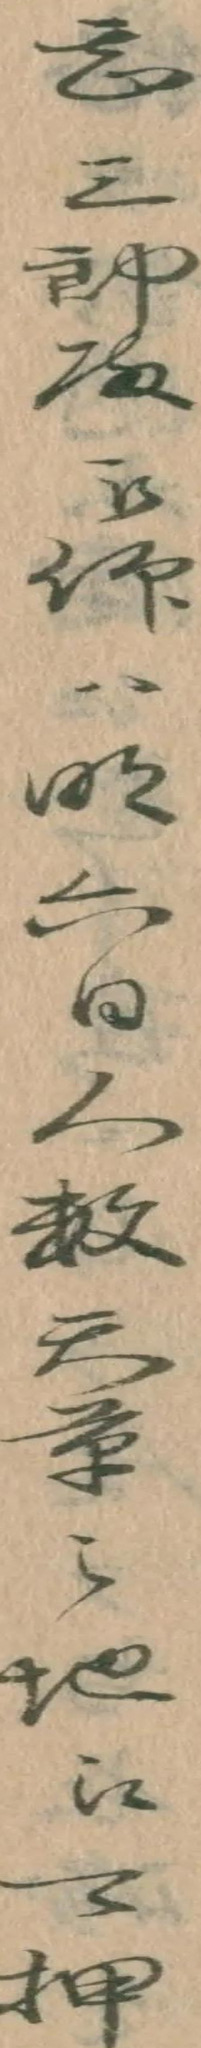甚三郎殿被仰は明六日人数天草之地江可押
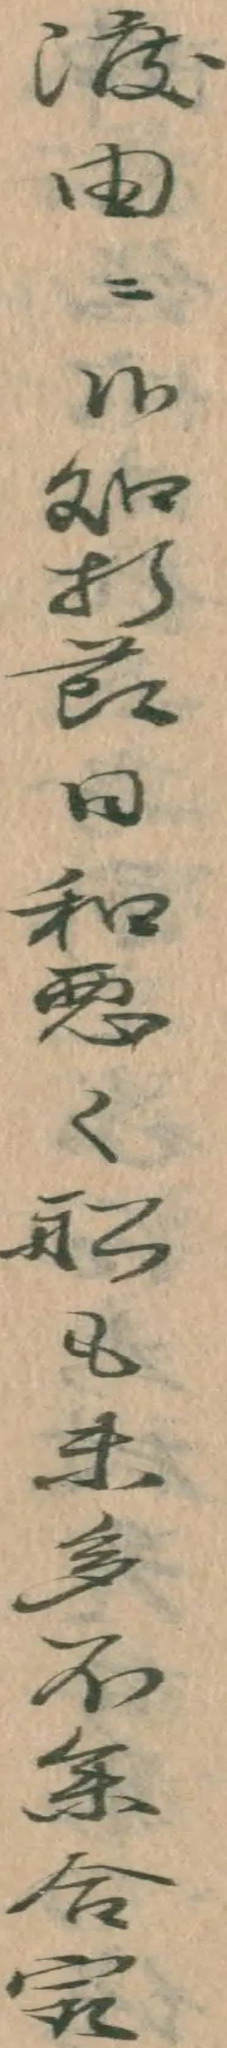渡由に候処折節日和悪く船も未多不参合最
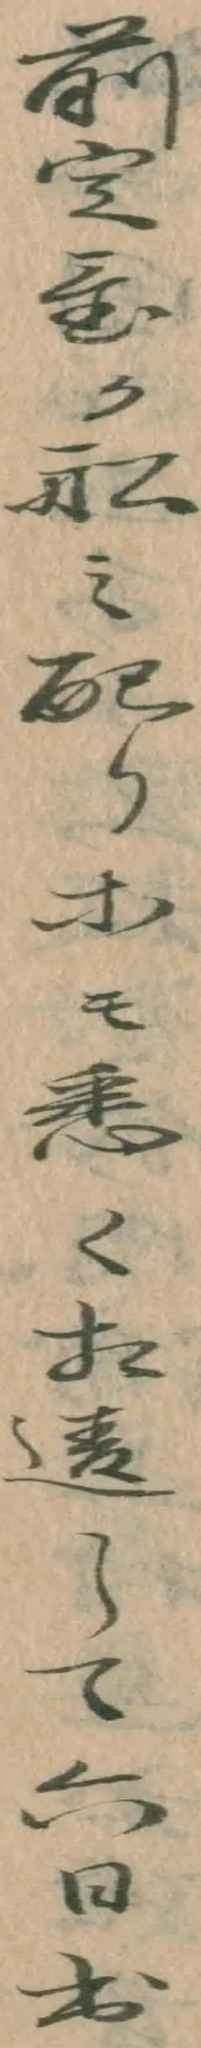前定置く船之配り等も悉く相違して六日出
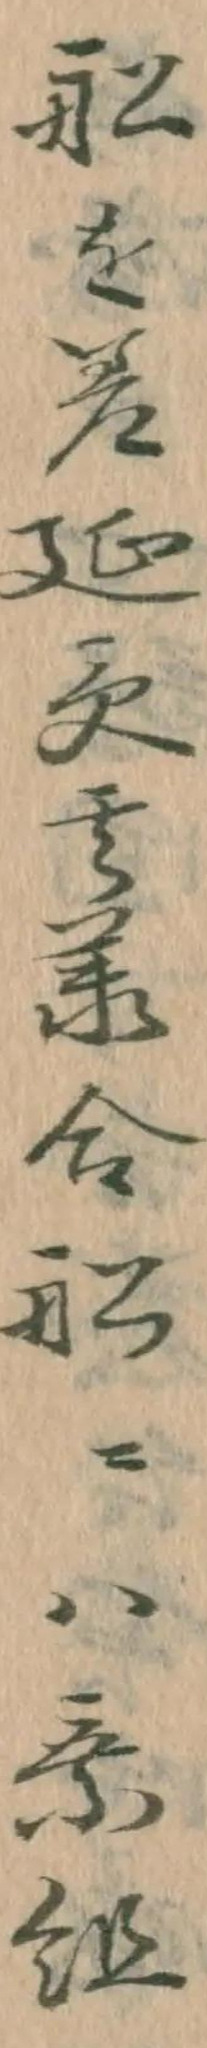船を差延受其承合船には乗組
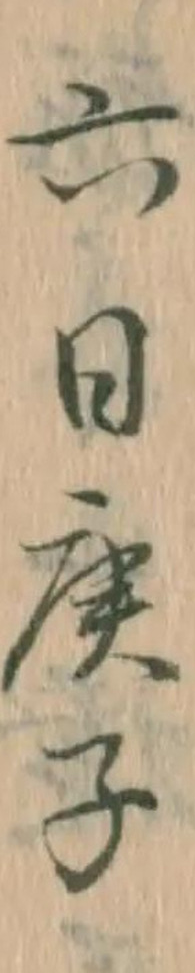六日庚子
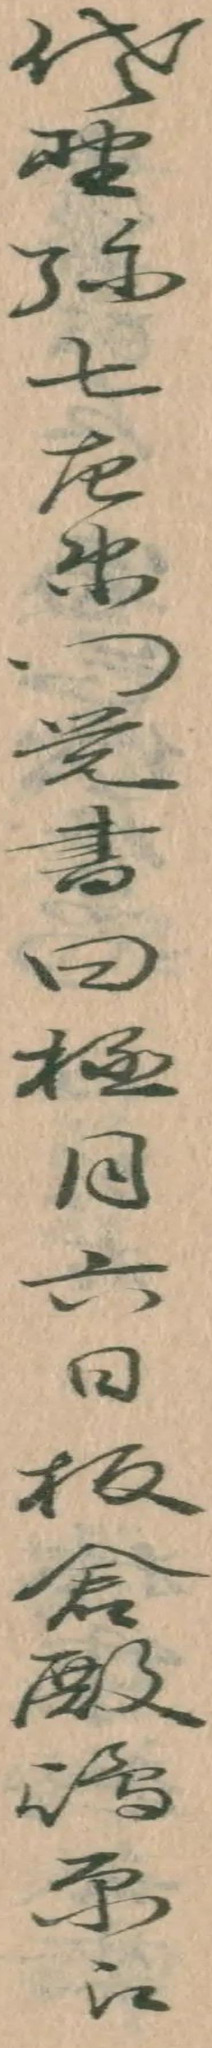佐野弥七左衛門覚書曰極月六日板倉殿島原江
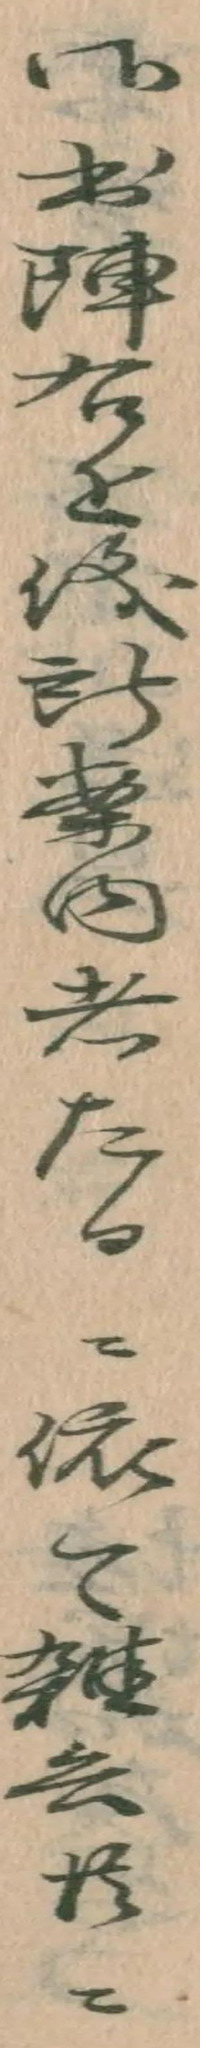御出陣右近儀所案内者たるに依て雑兵共に
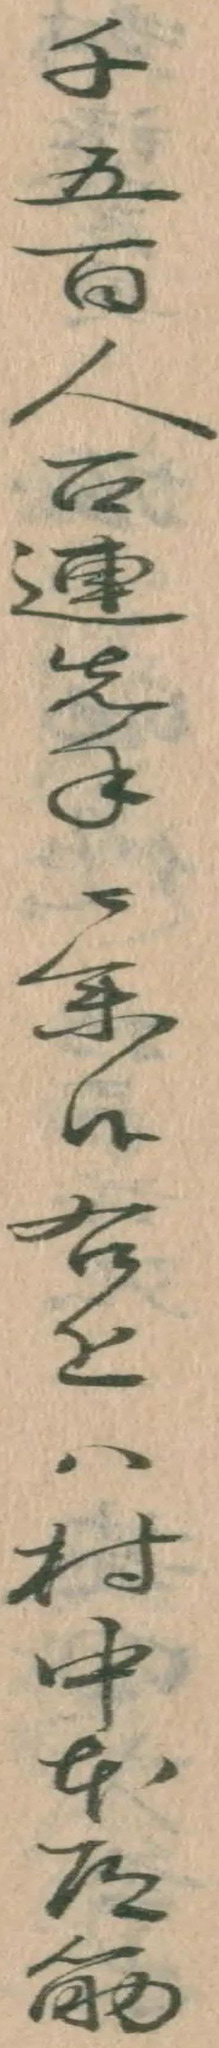千五百人召連先手に参候右近は村中本道筋
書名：切支丹御退治記 49巻. [3]
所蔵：国立国会図書館 National Diet Library, JAPAN
